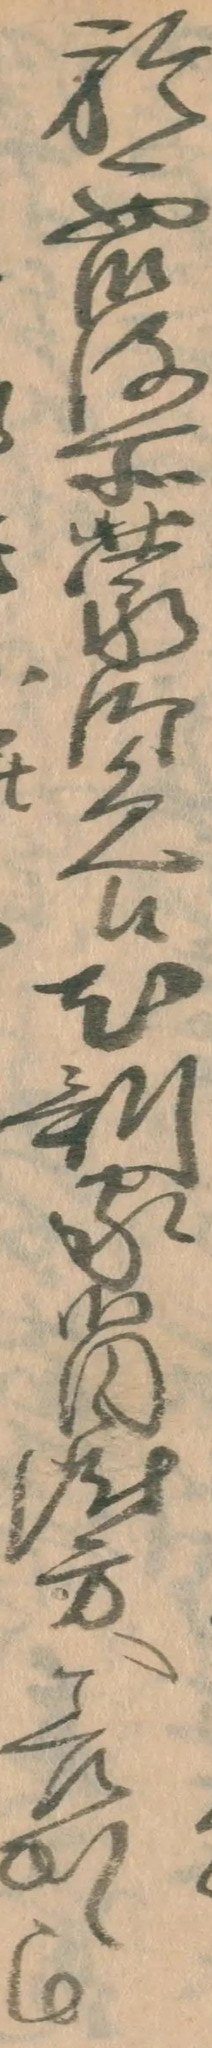於西御役所蒙御免候尤新家御目附方へ差出候由
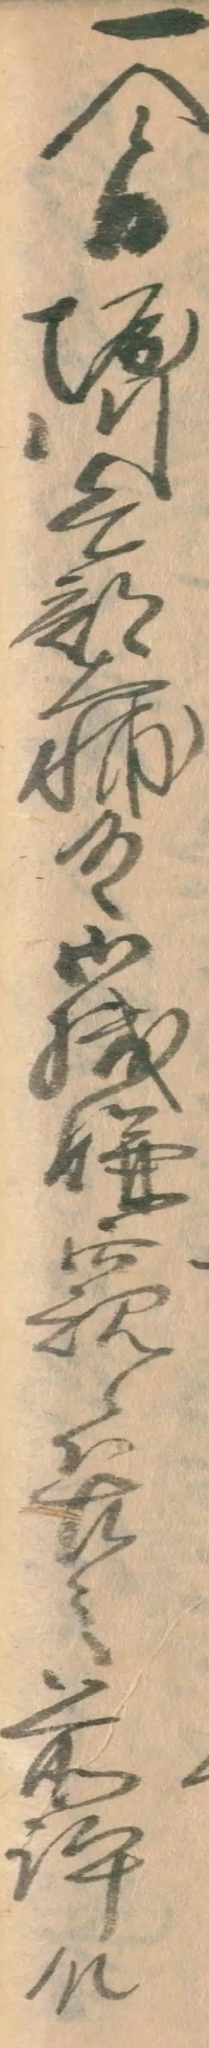一今日堀川兵部大輔殿御機嫌窺候筈之前評故
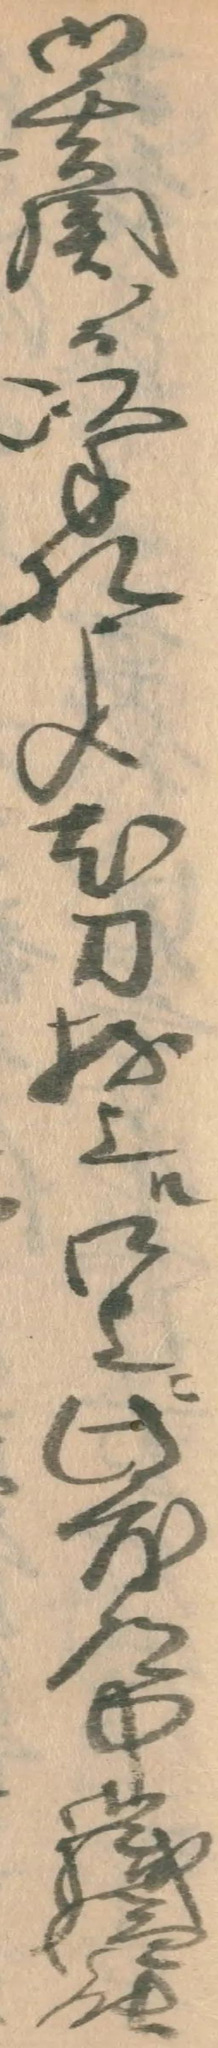御玄関ニ而以手札申入尤刀抔上ル口上ニ此度道中御機嫌能
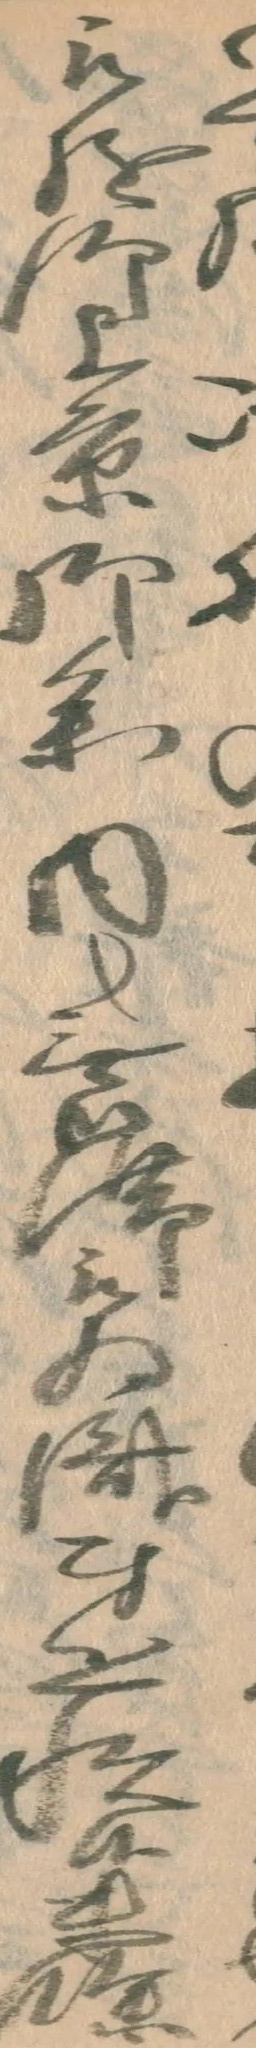被遊御上京御参内も無御滞被為済奉恐悦候
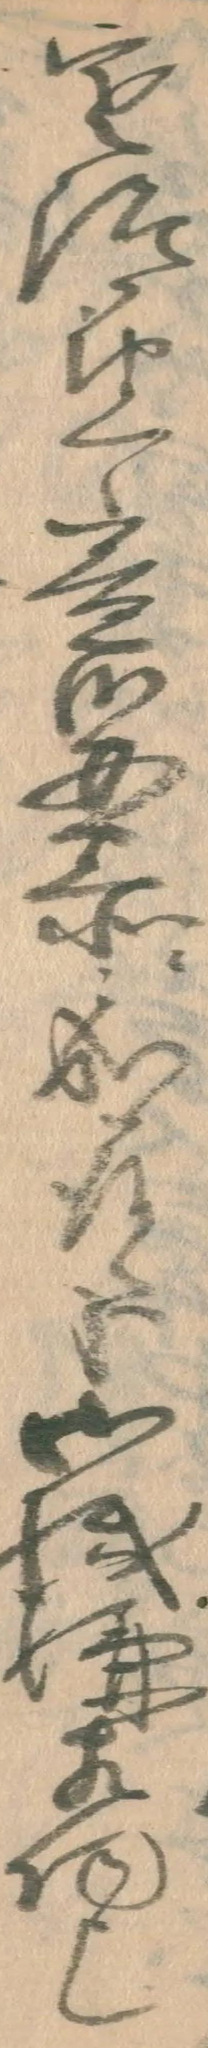寒冷御座候益御安泰ニ被成御座候哉御機嫌相伺申候
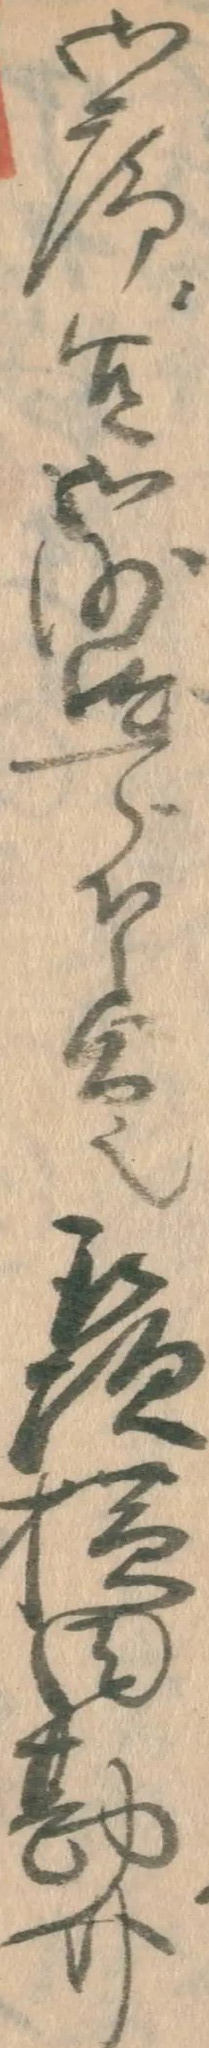御序ニ宜御沙汰可被下候旨也取次横田勘介
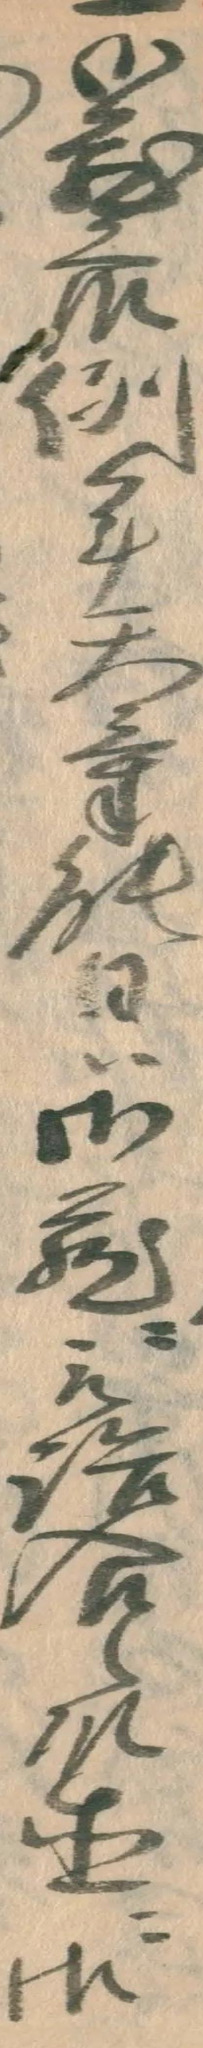一御蔵衆例年天気能日ハ御蔵ニ被詰合候故直ニ御
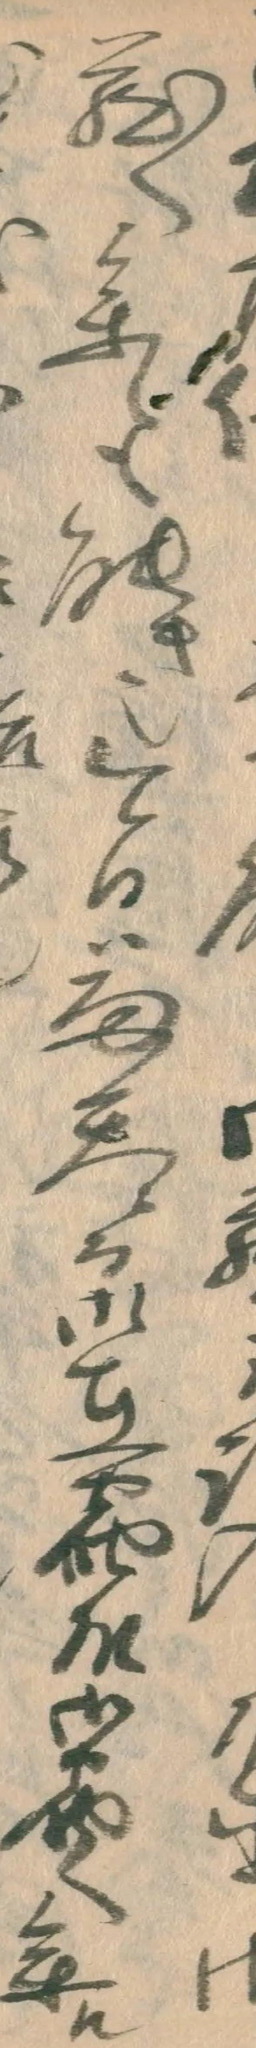蔵へ参候も能キ也今日ハ雨天ニ而御在宿故御宿へ参ル
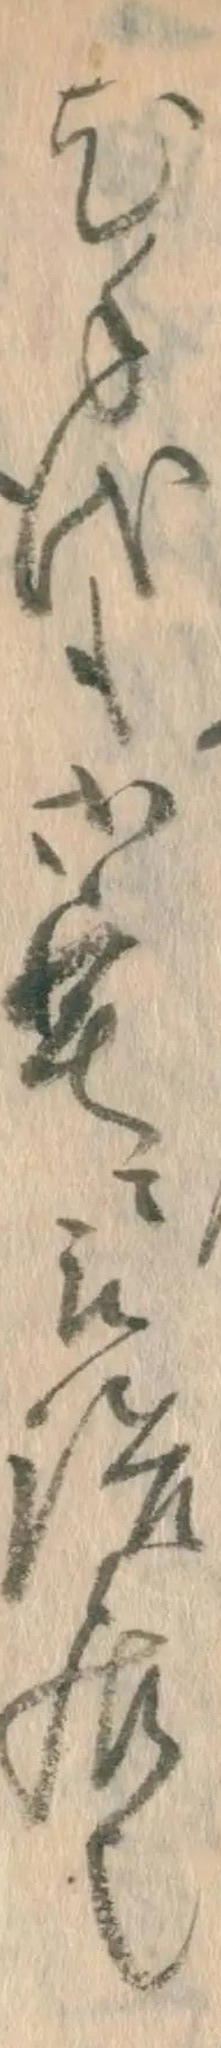尤手代も御宅ニ被詰居也
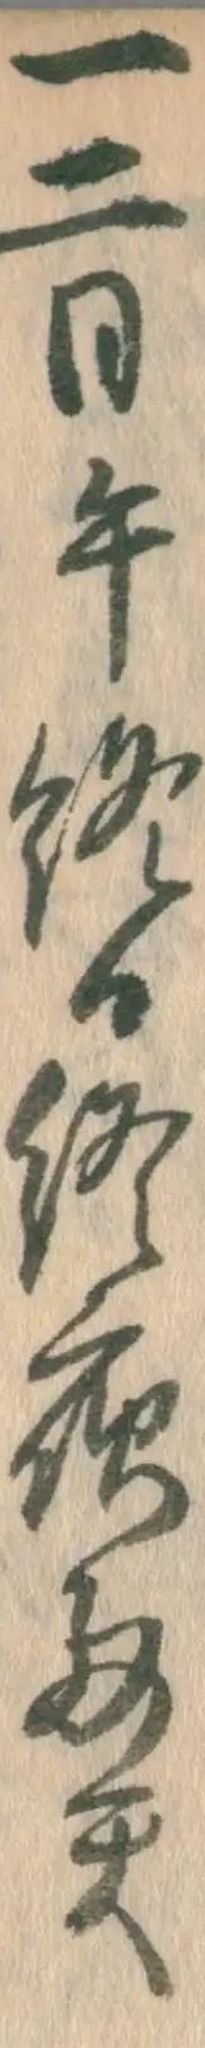一二日午終日終夜雨天
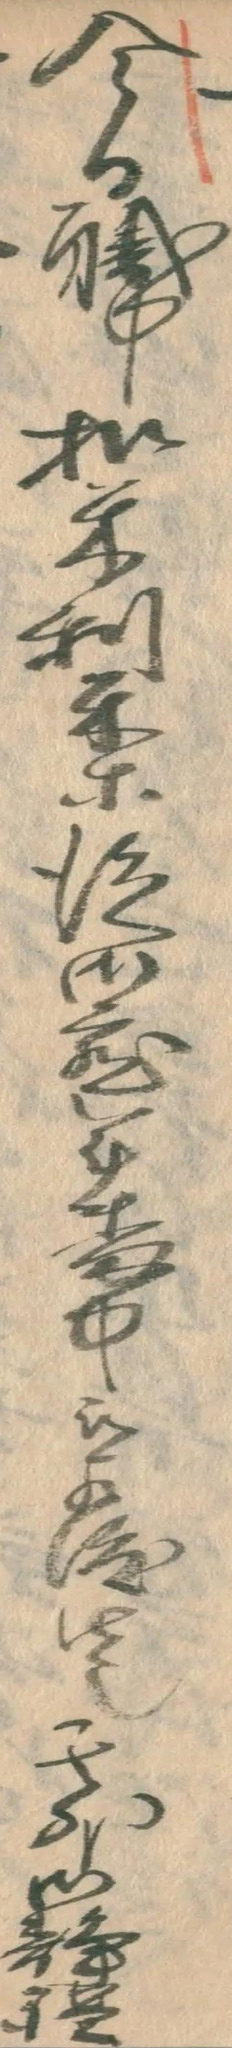今日職中扣米利米等従御蔵年御番中被相渡由也其外御静謐
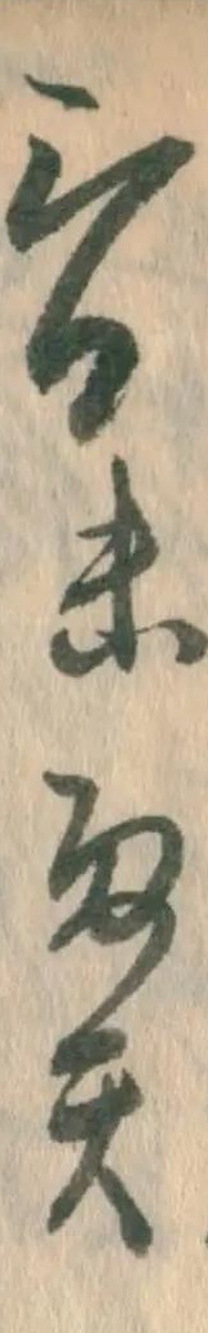三日未雨天
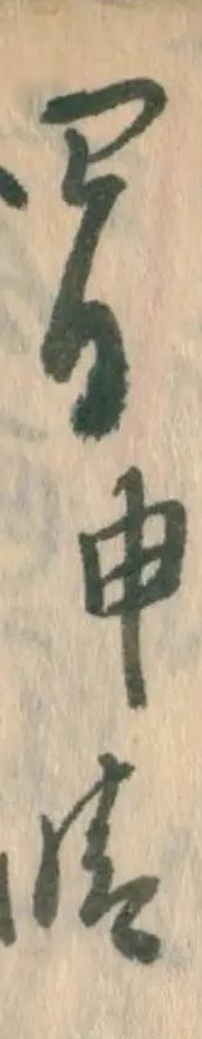四日申晴

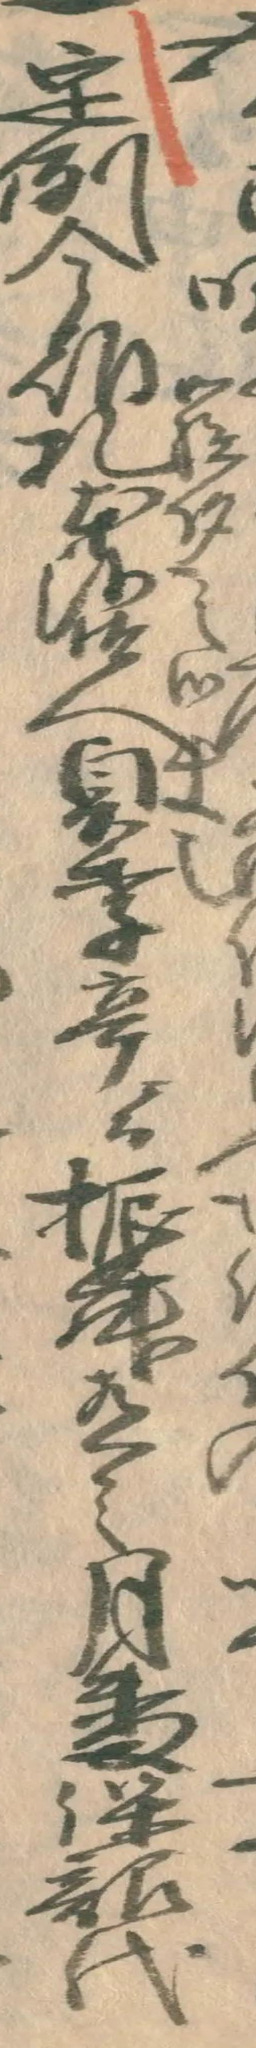一定例今朝札本沙汰人貞季亭ニ而振舞有之月番保韶代
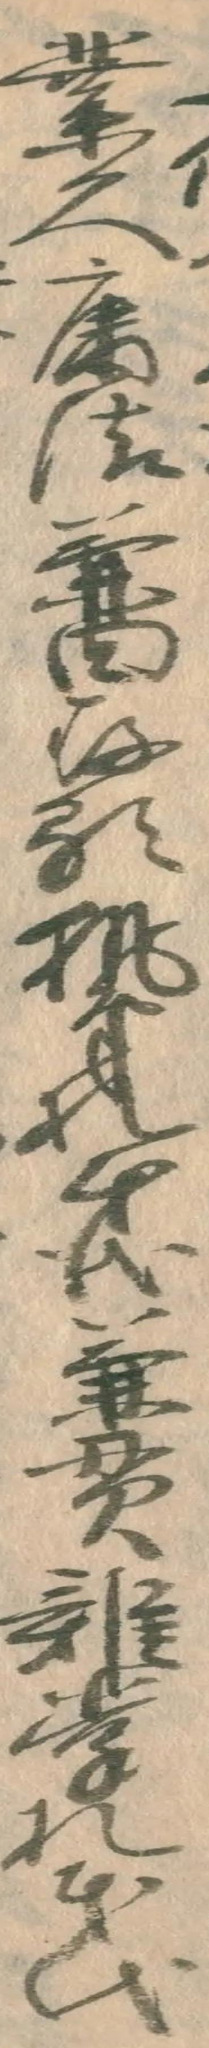業久庸清兼田存顕執筆札本代兼貫雑掌札本代
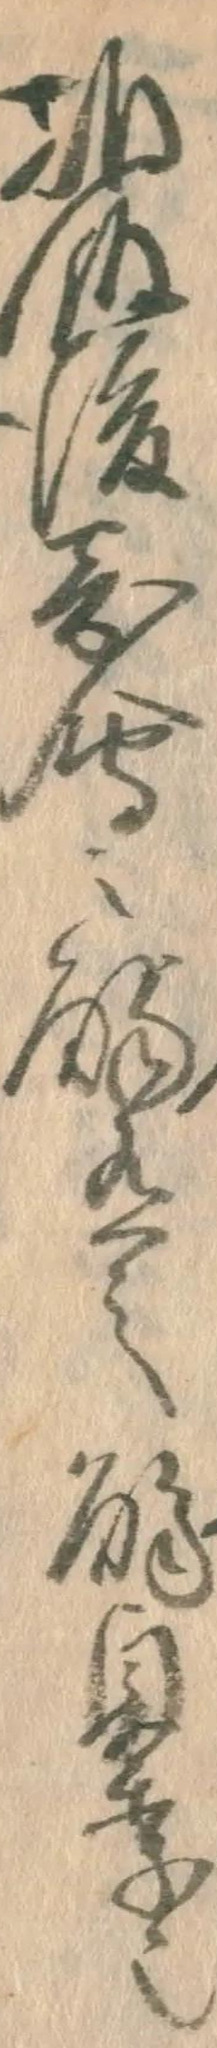朝飯後寄会之触有之触貞季也
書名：賀茂社記録. 第60冊
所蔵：国立国会図書館 National Diet Library, JAPAN
